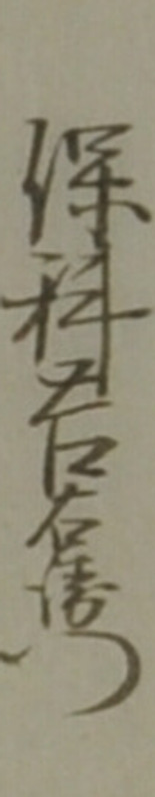保科吉右衛門

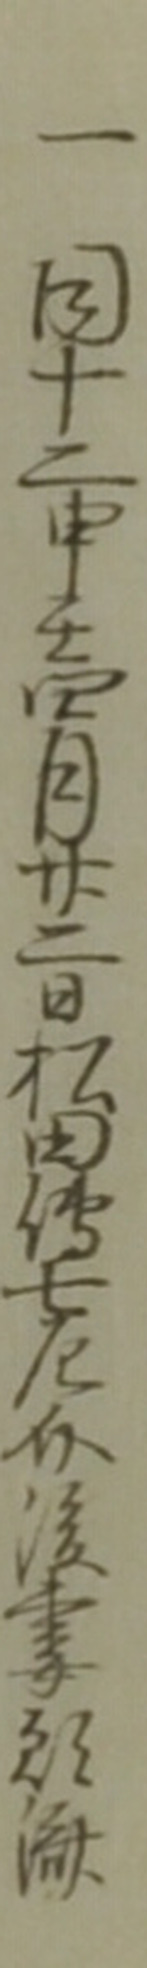一同十二甲閏四月廿二日松田伝七厄介後妻願済
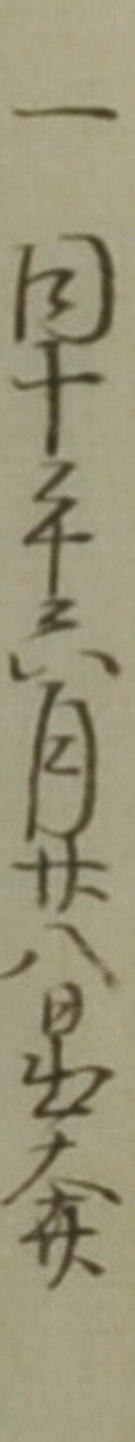一同十午六月廿八日出奔
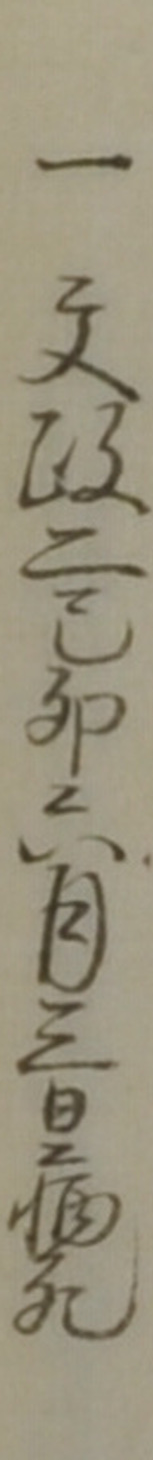一文政二己卯六月三日病死
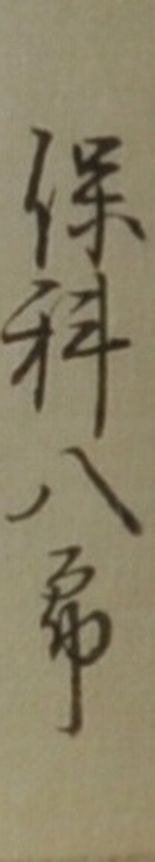保科八郎
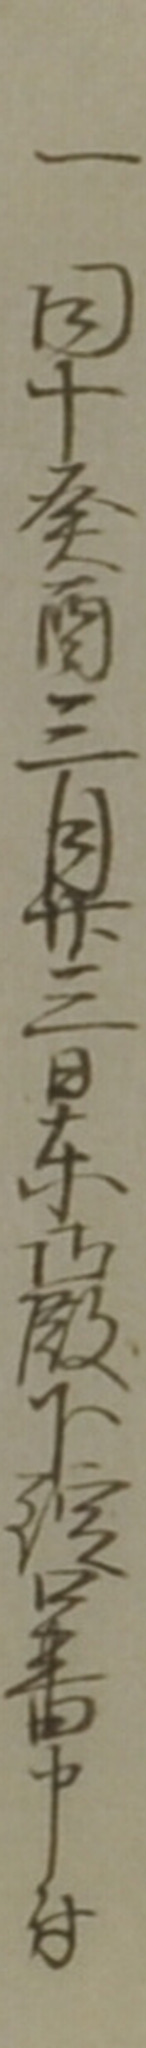一同十癸酉三月廿三日東御殿下錠口番申付
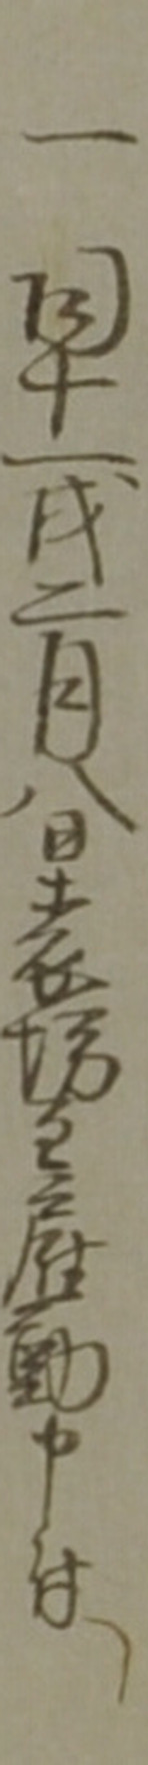一同十一戌二月八日表坊主雇勤申付
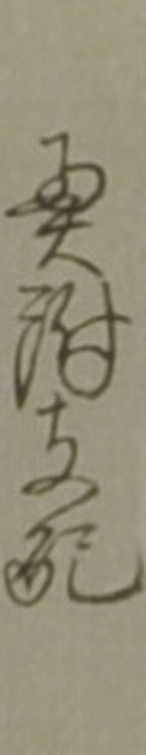奥附支配
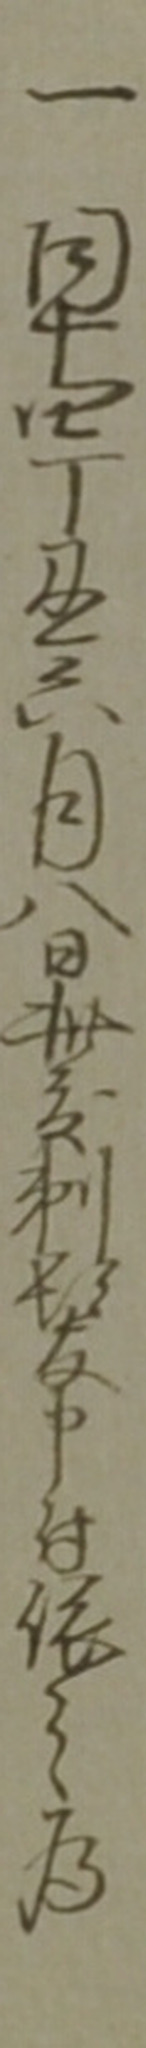一同十四丁丑六月八日此度刺髪申付依之為
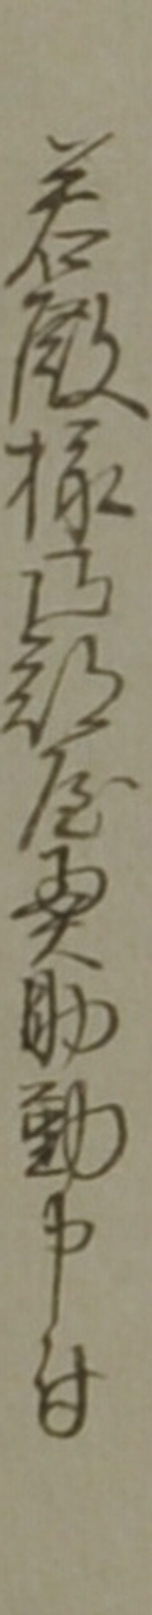若殿様御部屋奥助勤申付
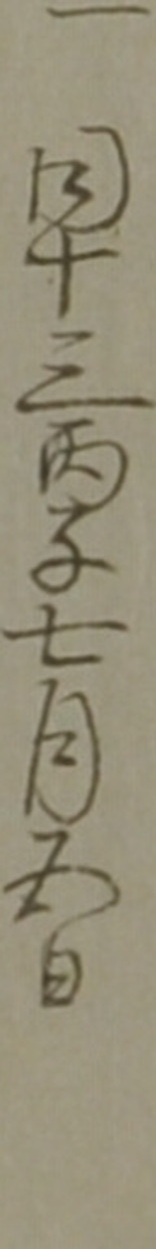一同十三丙子七月五日
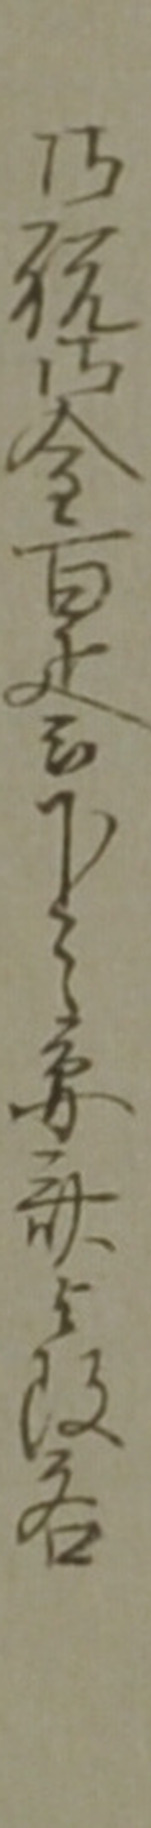御祝御金百疋被下之円斉と改名
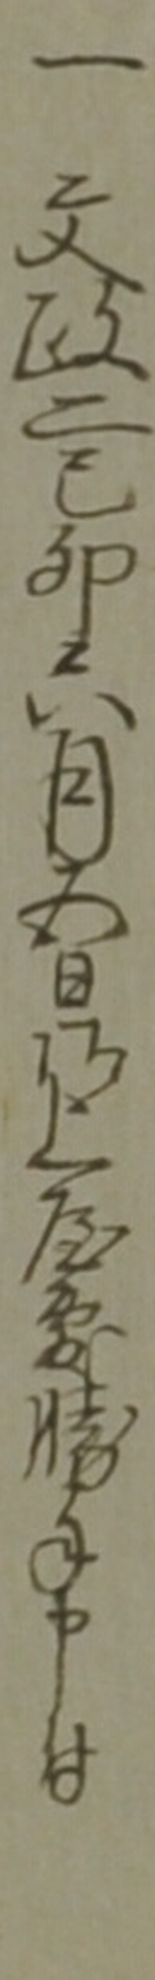一文政二己卯六月五日御上屋敷勝手申付
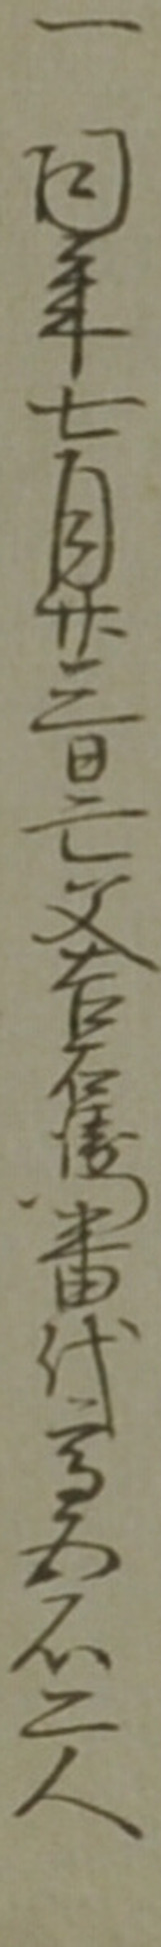一同年七月廿三日亡父吉右衛門番代高五石二人
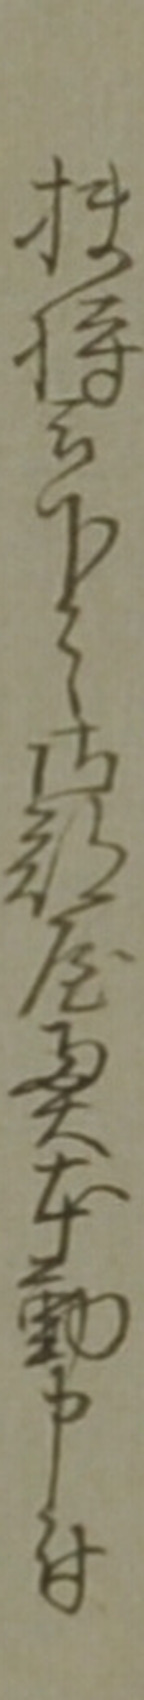扶持被下之御部屋奥本勤申付

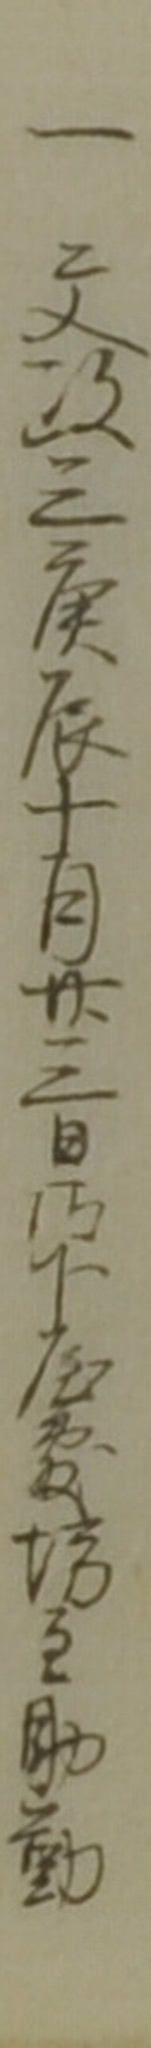一文政三庚辰十月廿三日御下屋敷坊主助勤
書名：無足廃家（弐）
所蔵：伊那市立高遠町図書館・合同会社AMANE
